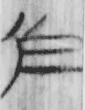於
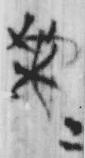枼枼
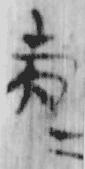大夫
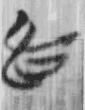左
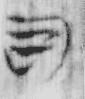司
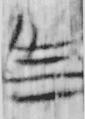馬
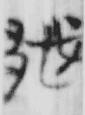○（越）
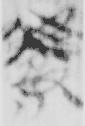虩
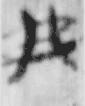弗
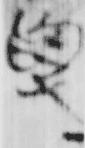受
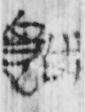○（盛）
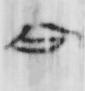公
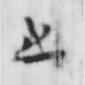之
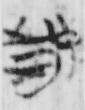歲（歲）
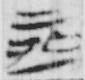亟（期）
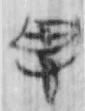思
